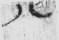八
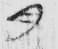月
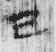己
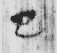巳
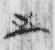之
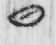日
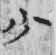少
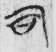司
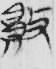敗
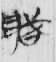戕
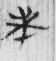未
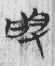受
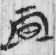○（期）
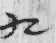九
